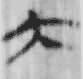大
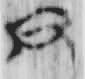尹
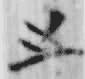之
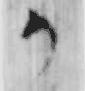人
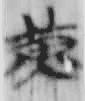黃
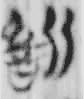○（慎）
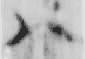八
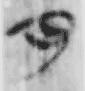月
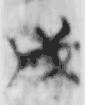戊
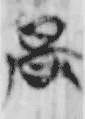晨
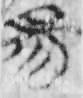昜（陽）
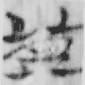莫
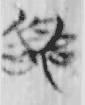囂
